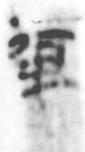車
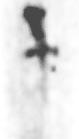十
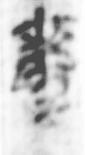𨍱（乘）
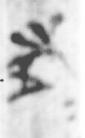又
